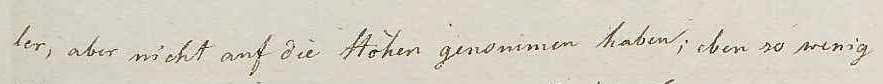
ler, aber nicht auf die Höhen genommen haben; eben so wenig
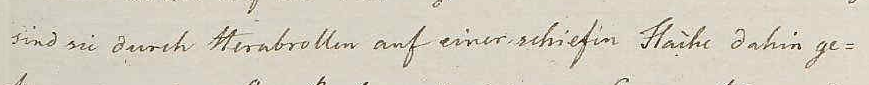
sind sie durch Herabrollen auf einer schiefen Fläche dahin ge-
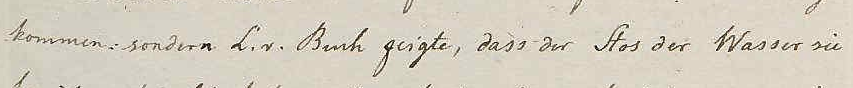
kommen: sondern L. v. Buch zeigte, dass der Stos der Wasser sie
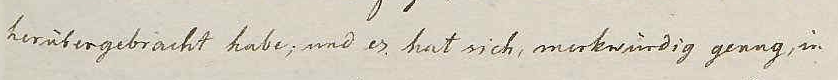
herübergebracht habe; und es hat sich, merkwürdig genug, in
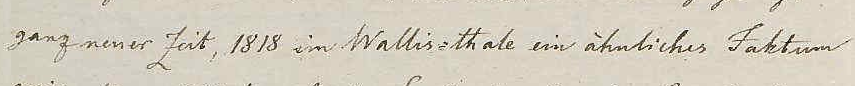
ganz neuer Zeit, 1818 im Wallis-thale ein ähnliches Faktum
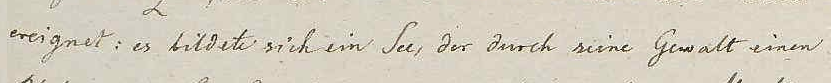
ereignet: es bildete sich ein See, der durch seine Gewalt einen
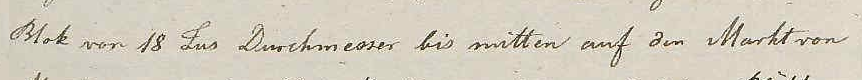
Blok von 18 Fus Durchmesser bis mitten auf den Markt von
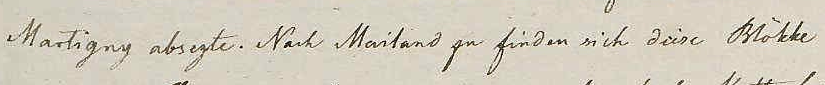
Martigny absezte. Nach Mailand zu finden sich diese Blökke
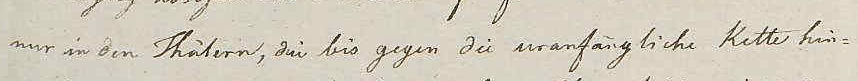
nur in den Thälern, die bis gegen die uranfängliche Kette hin-
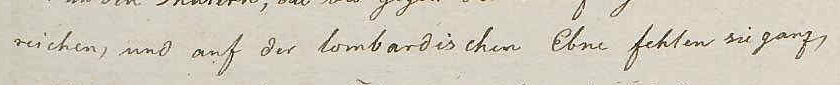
reichen, und auf der lombardischen Ebne fehlen sie ganz,
